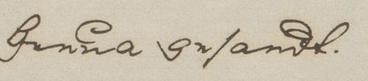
Genua gesandt.
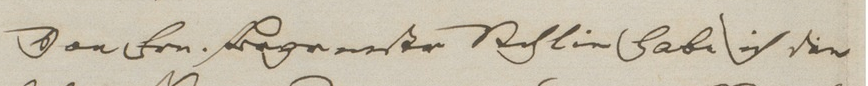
Von Hrn. Brgrmstr Stehlin habe ich den
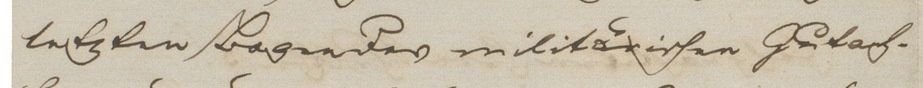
letzten Bogen des militärischen Gutach-
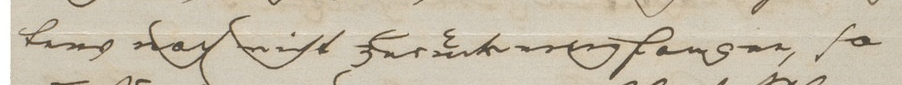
tens noch nicht zurückempfangen, so
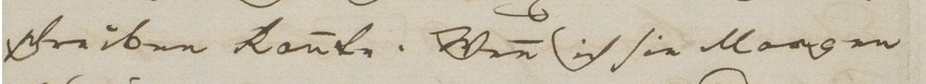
schreiben konnte. Wenn ich sie Morgen
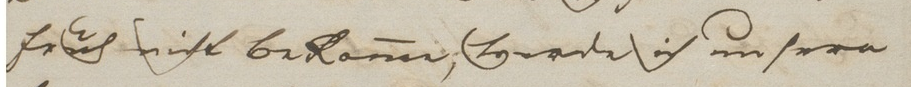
früh nicht bekomme, werde ich unsern
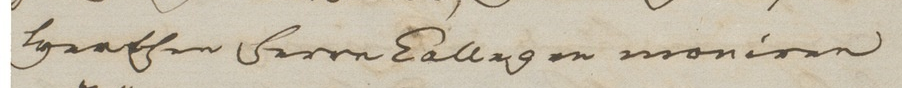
werthen Herrn Collegen moniren
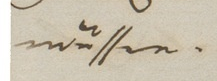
müssen.
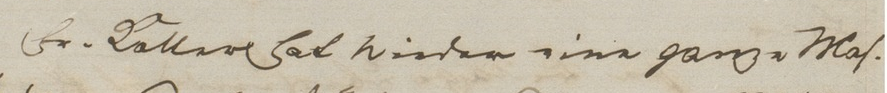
Hr. Koller hat wieder eine ganze Mas-
